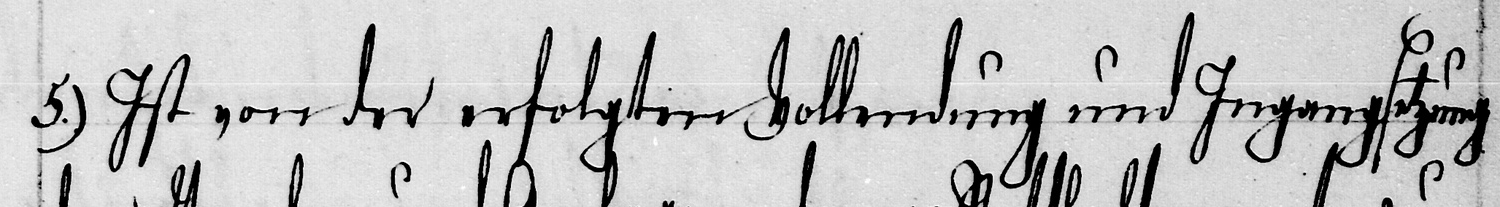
5.) Ist von der erfolgten Vollendung und Ingangsetz¬
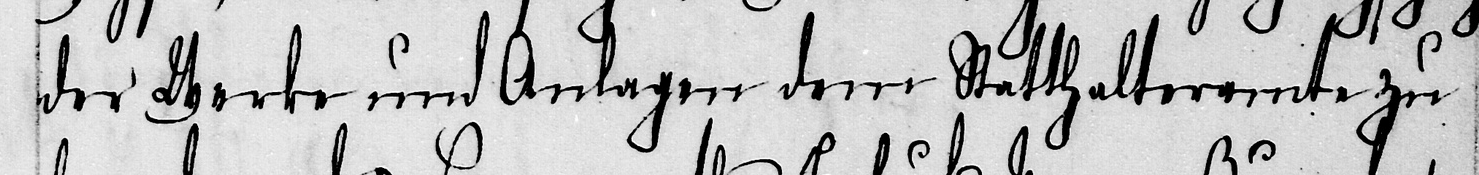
der Werke und Anlagen dem Statthalteramte zu
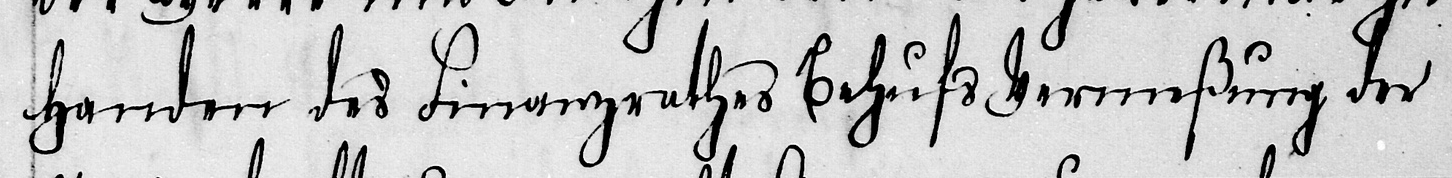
Handen des Finanzrathes Behufs Vermeßung der
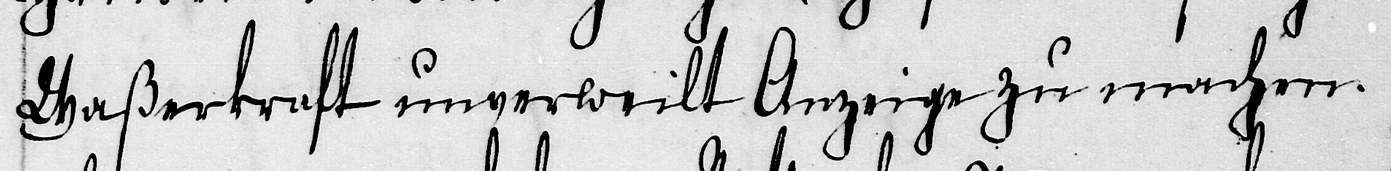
Waßerkraft unverweilt Anzeige zu machen.
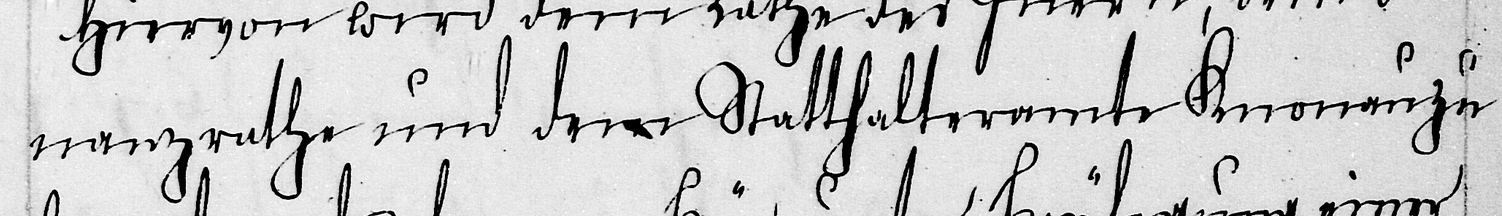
nanzrathe und dem Statthalteramte Knonau zu
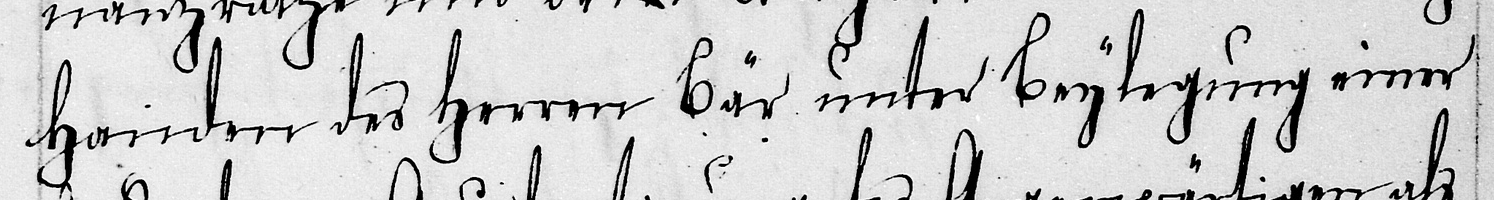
Handen des Herren Bär unter Beylegung einer
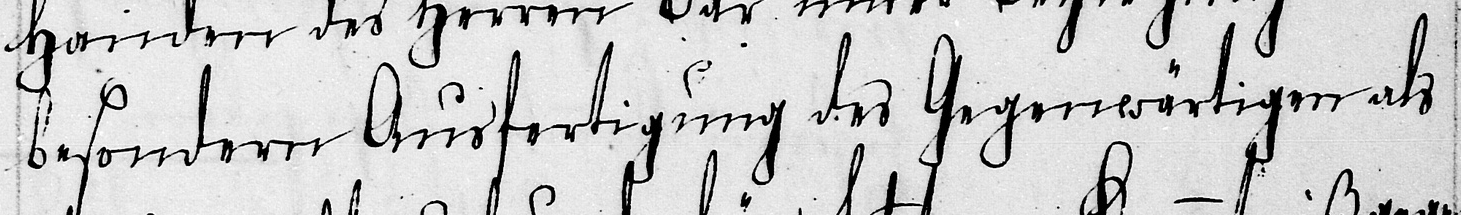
besondern Ausfertigung des Gegenwärtigen als
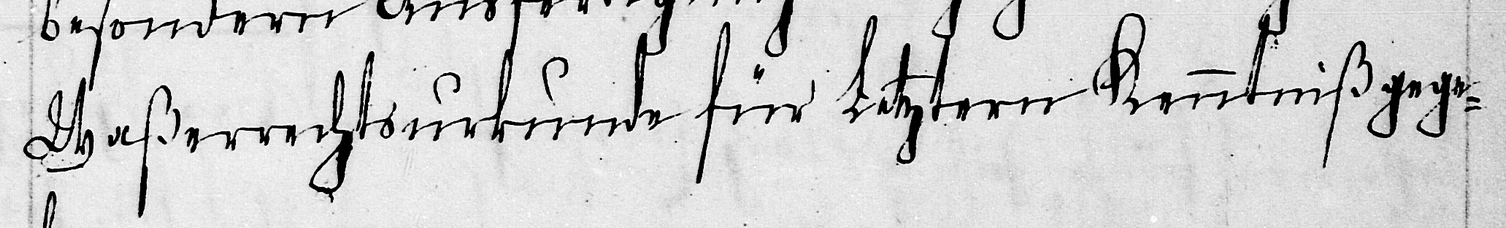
Waßerrechtsurkunde für Letztern Kenntniß gege¬
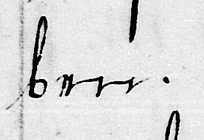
ben.
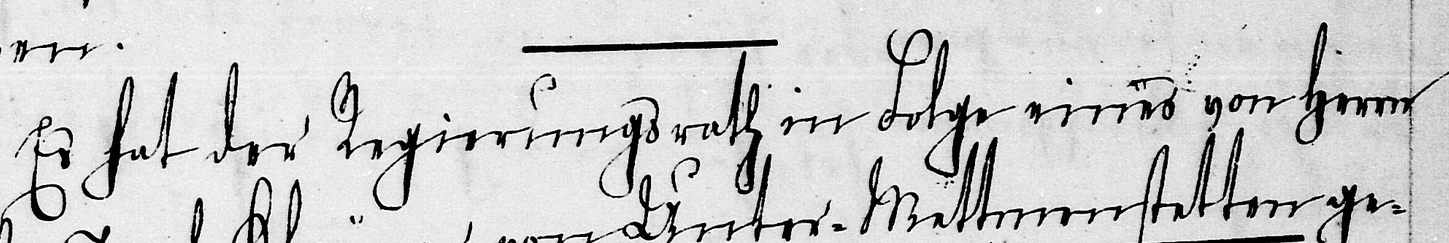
Es hat der Regierungsrath in Folge eines von Herrn
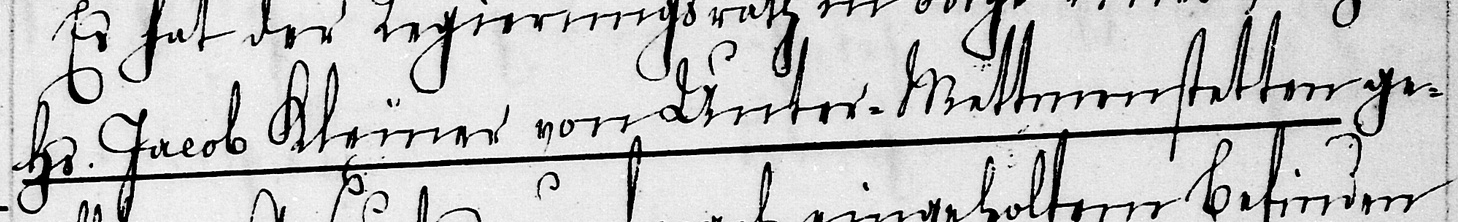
Hs. Jacob Kleiner von Unter-Mettmenstetten ges¬
